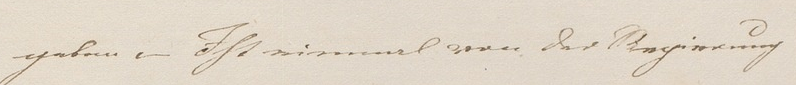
geben. Ist einmal von der Regierung
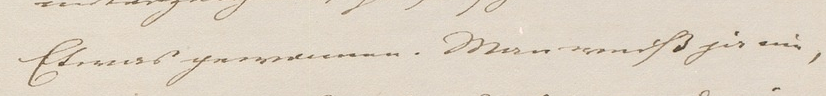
Etwas gewonnen. Man weiß ja nie,
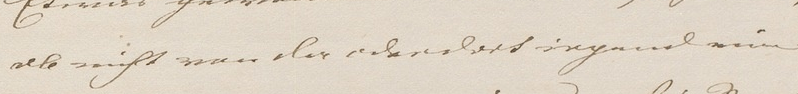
ob nicht von da oder dort irgend ein
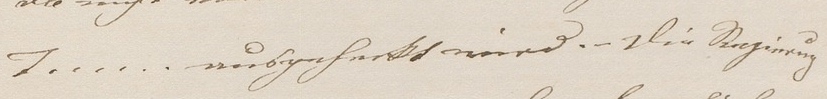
T.... ausgeheckt wird. Die Regierung
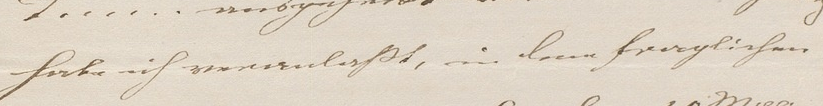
habe ich veranlaßt, in dem fraglichen
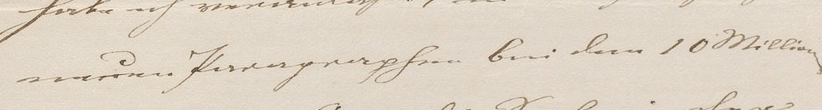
neuen Paragraphen bei den 10 Millionen
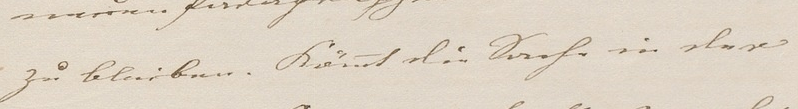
zu bleiben. Kömmt die Sache in der
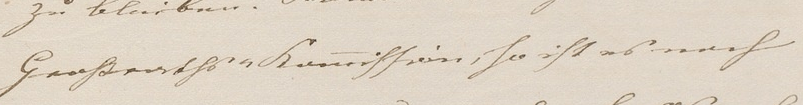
Großraths-Kommission, so ist es noch
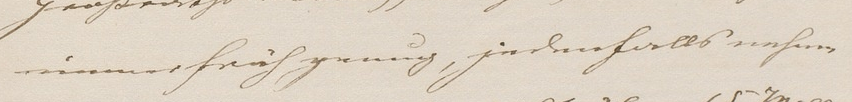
immer früh genug, jedenfalls nehme
